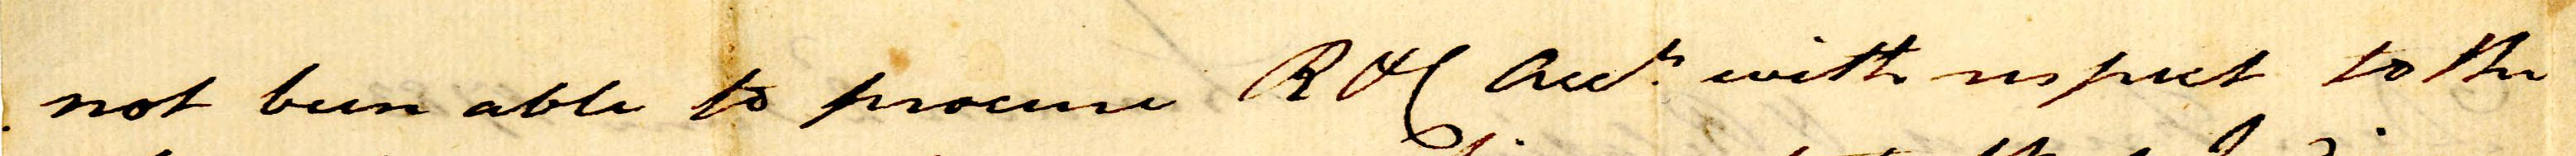not been able to procure R&C Acc^t. with respect to the
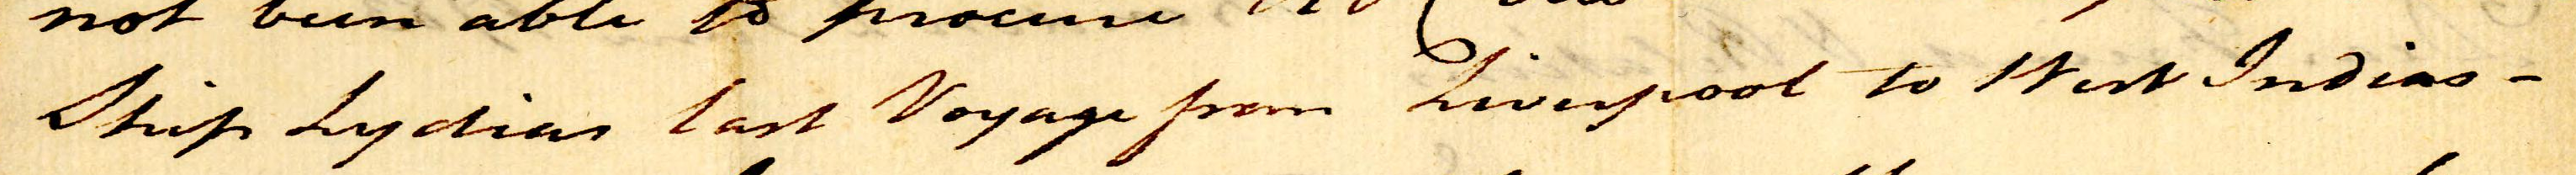Ship Lydias East Voyage from Liverpool to West Indias-
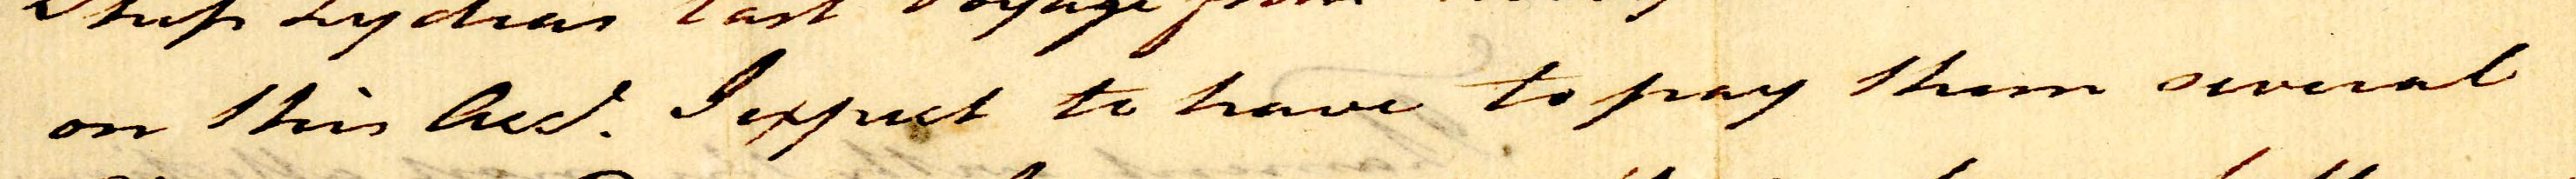on this Acc^t. I expect to have to pay them several
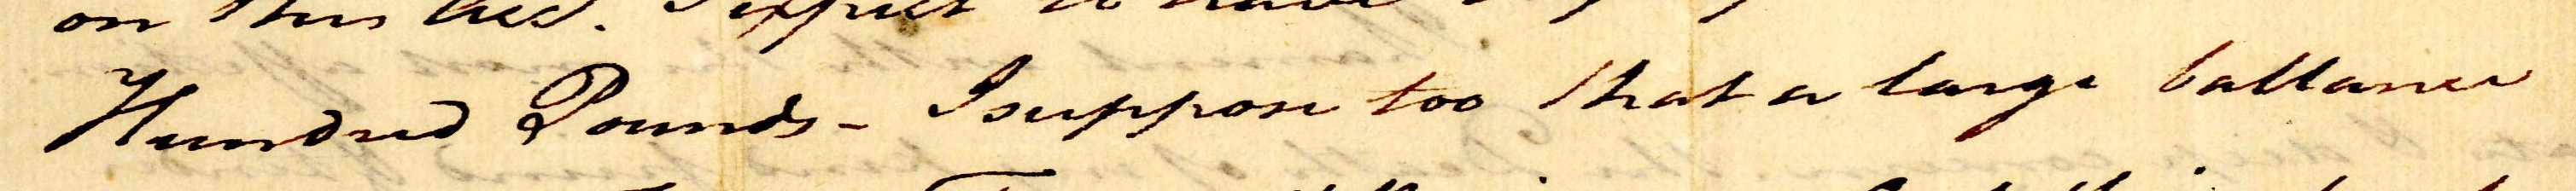Hundred Pounds. I suppose too that or large ballance
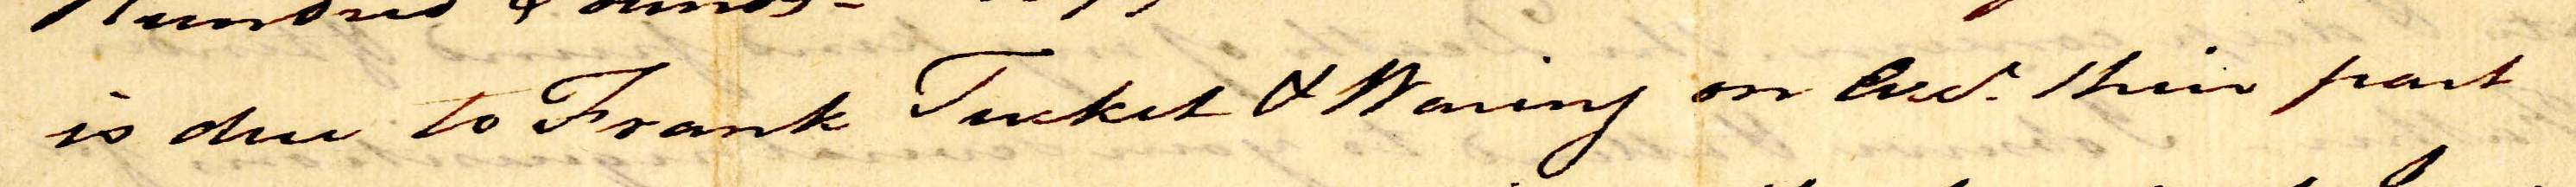is due to Frank Tucket & Waring on Acc^t. their part
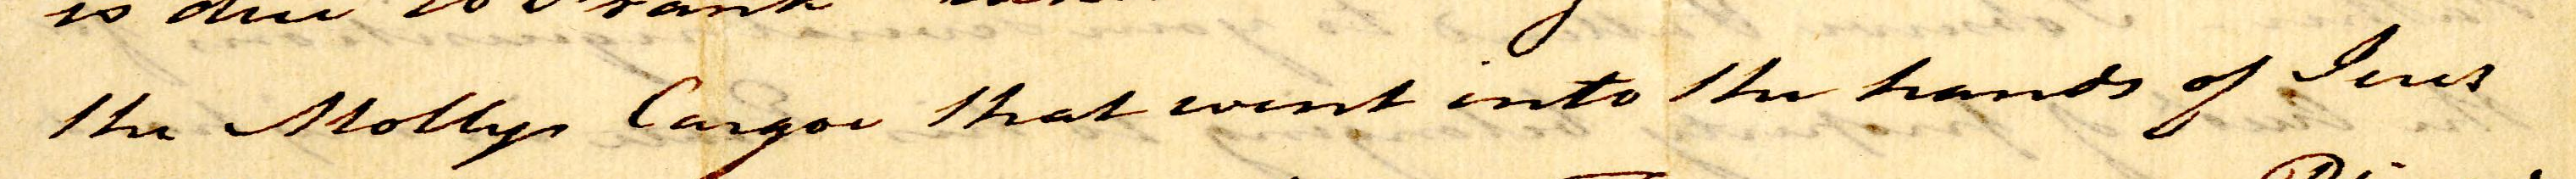the Mollys Cargo that went into the hands of Jeres
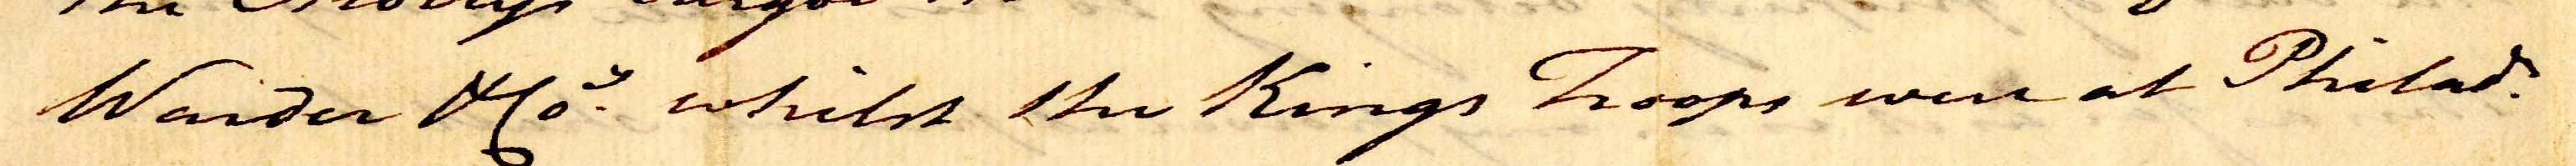Warder & Co^y whilst the Kings Troops were at Philad^a.
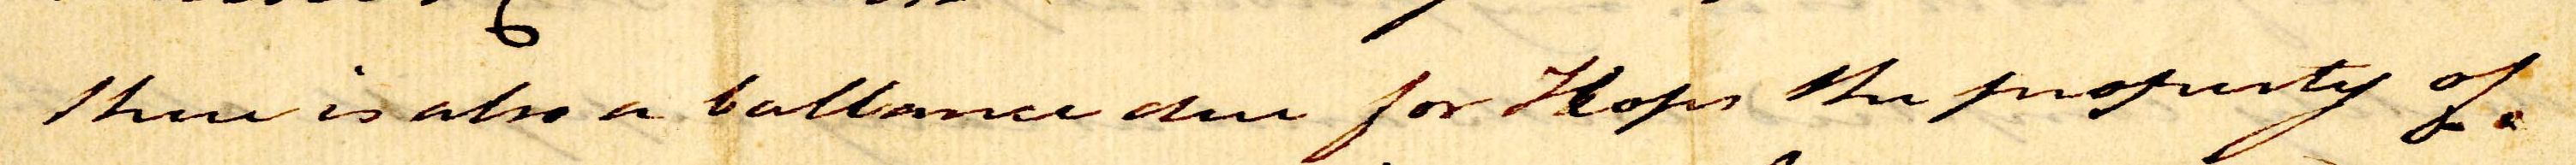there is also a ballance due for Hops the property of
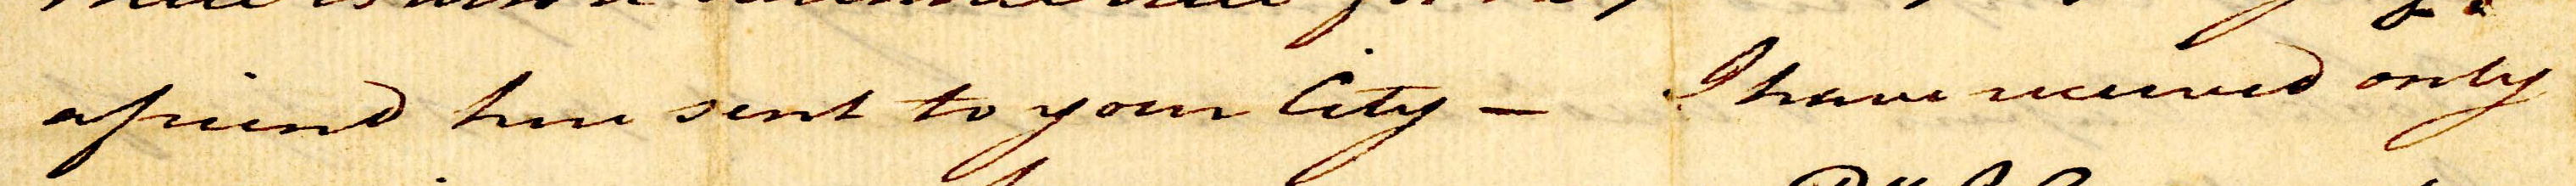a friend here sent to your City. I have received only
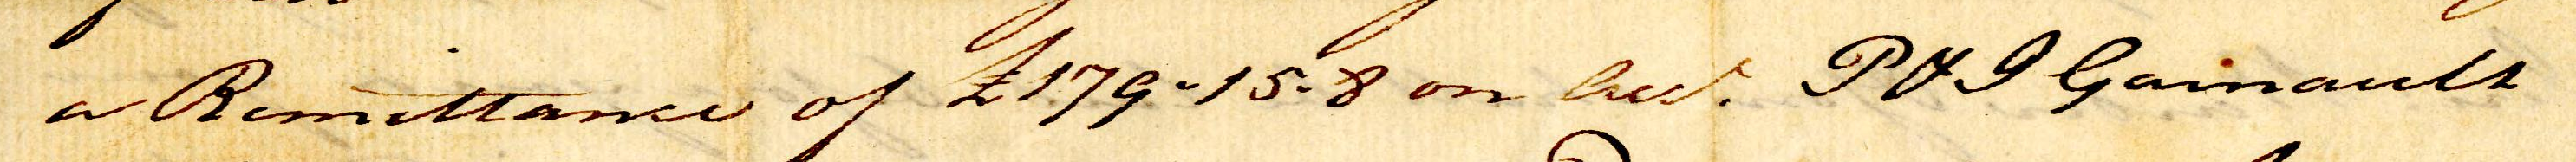a Remittance of £179.15.8 on Acc^t. P & J Gainault
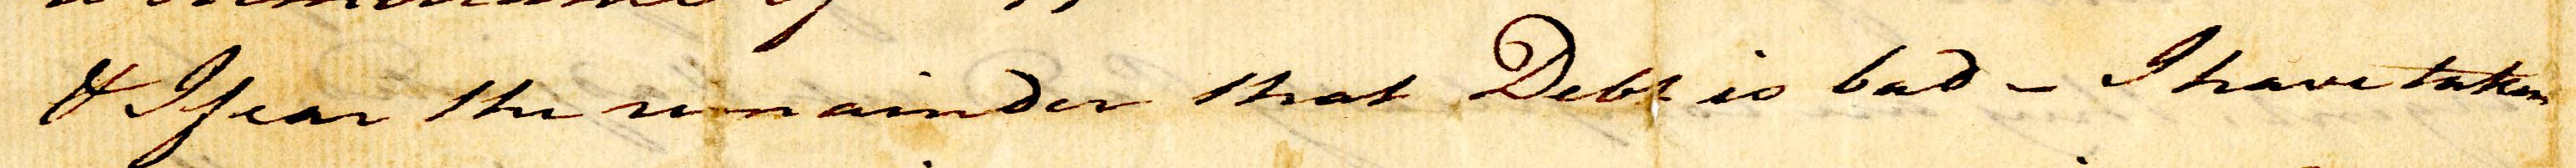& I fear the remainder that Debt is bad. I have taken
